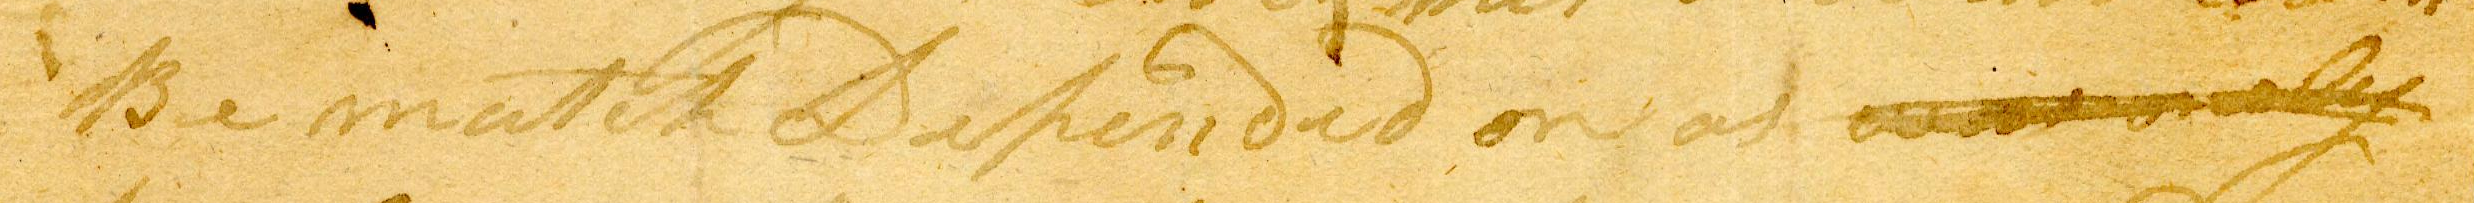Be match Depended on as [customaraly]
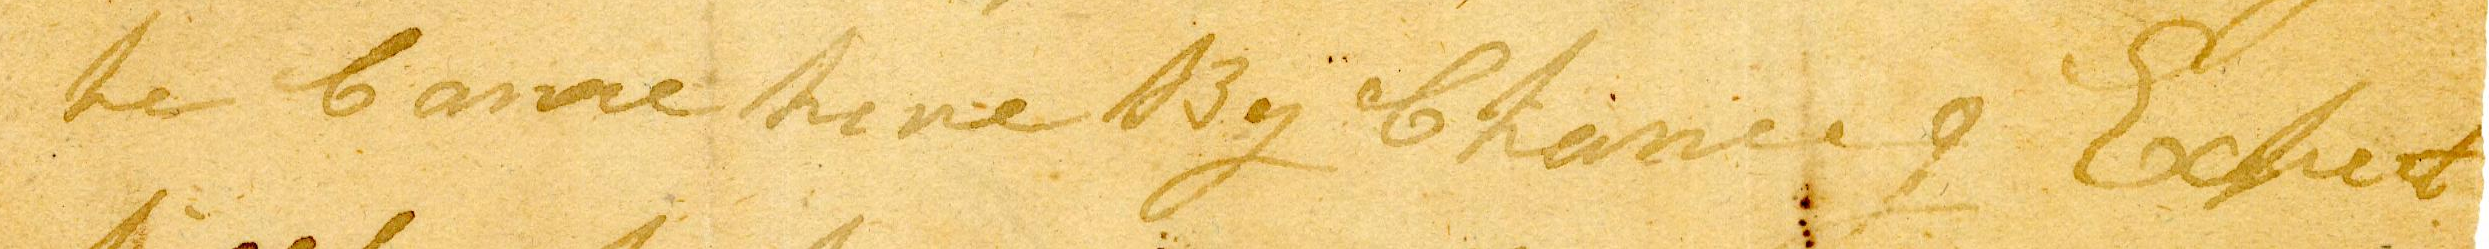he came here By Chance & Expect
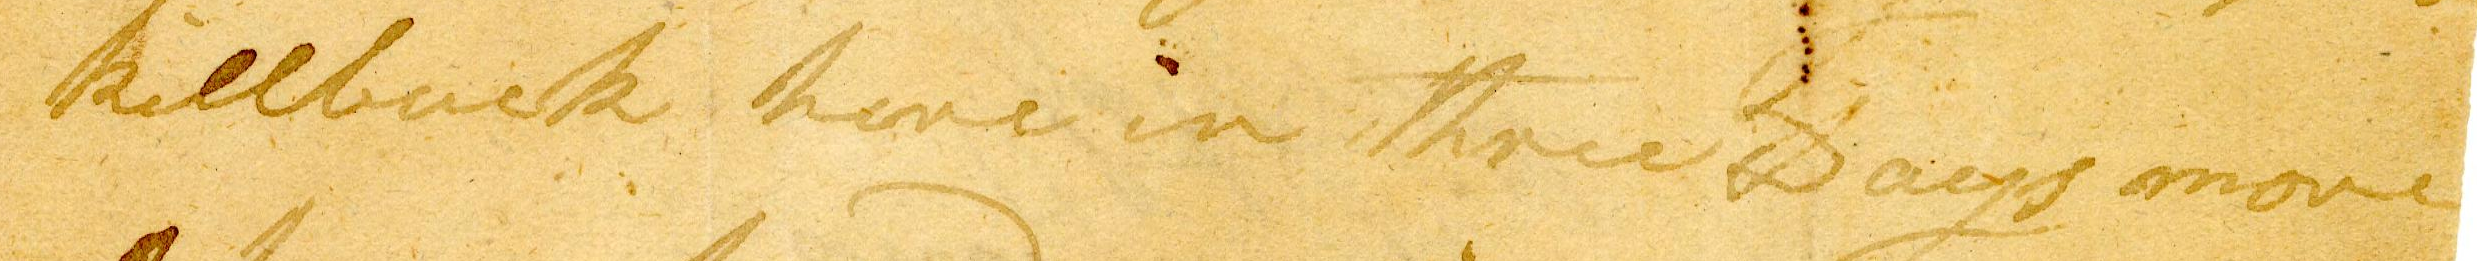killbuck have in three Days move
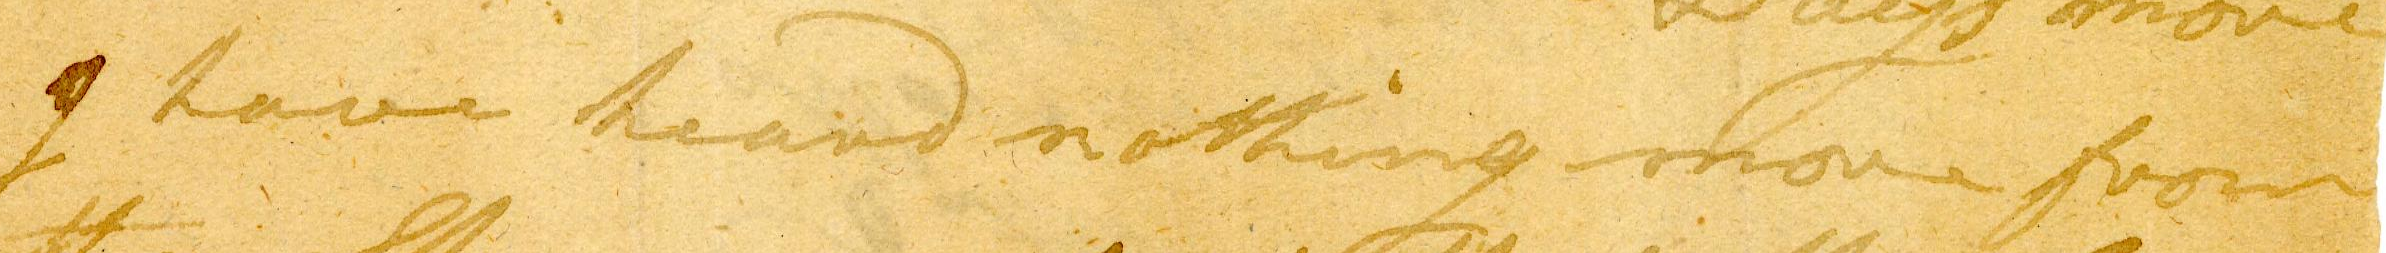I have heard nothing more from
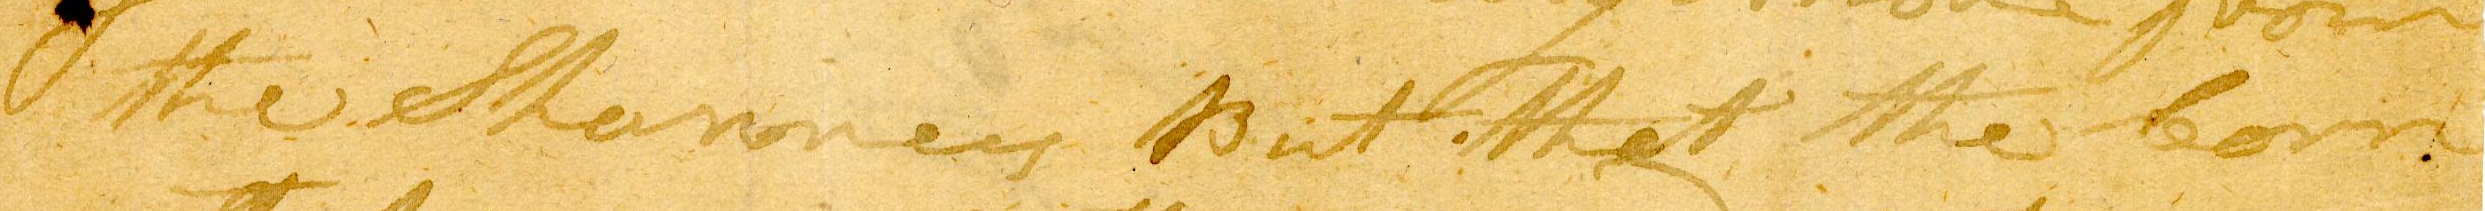the shannees But that the Corn
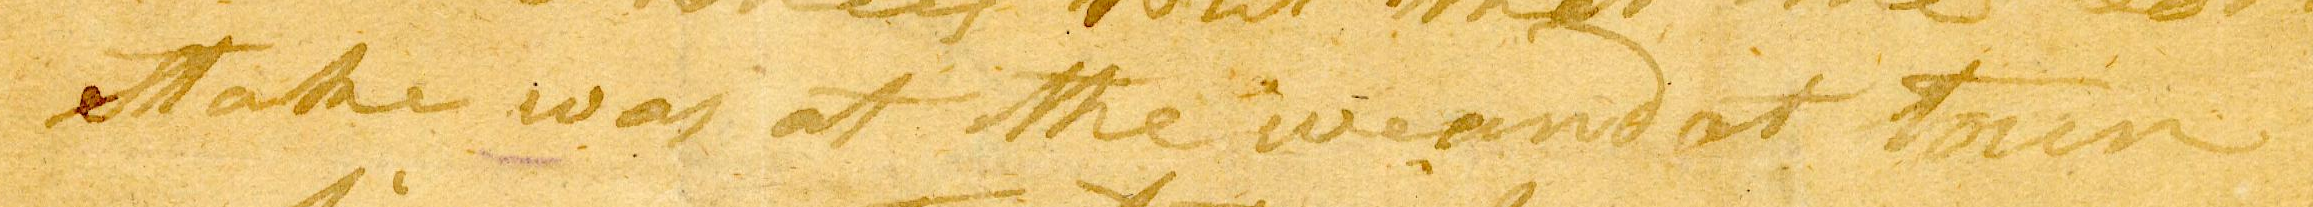Stake was at the weandat town
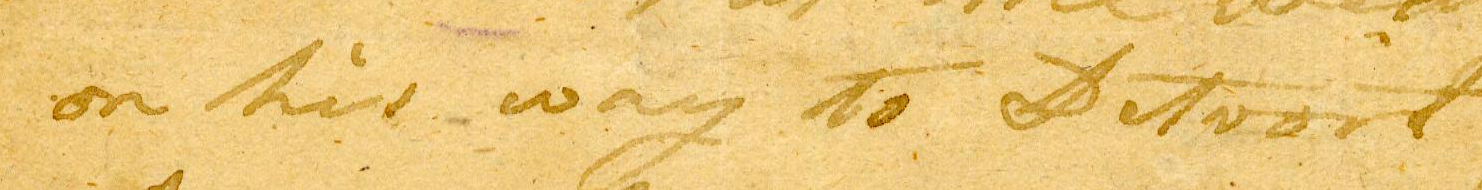on his way to Detroit
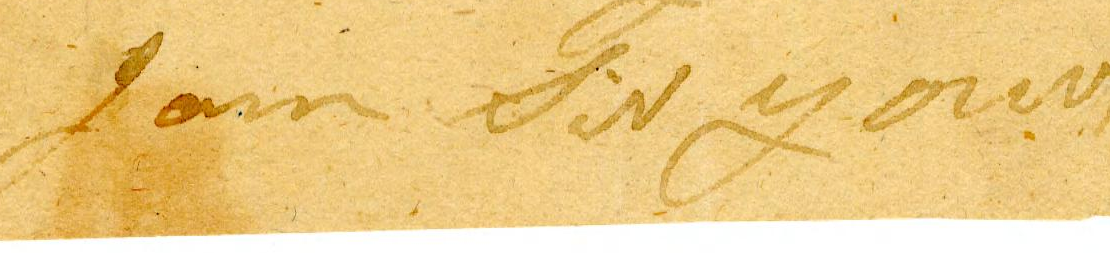I am Sir your
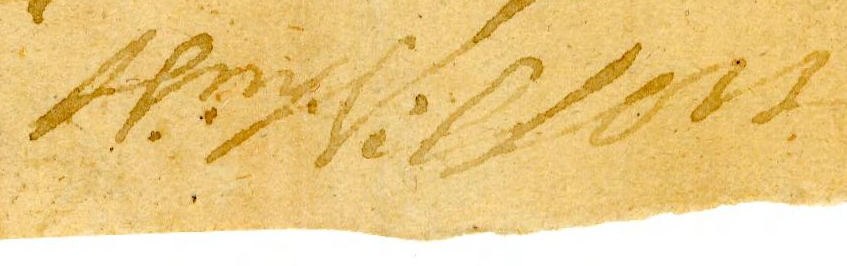Wm Wilson
